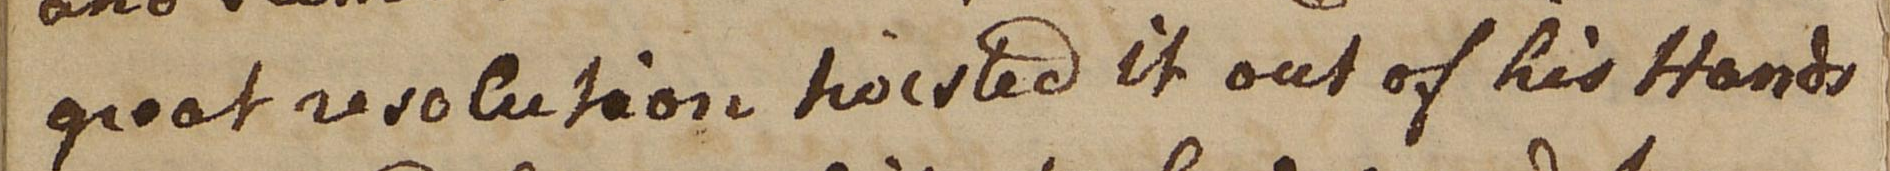great resolution twisted it out of his Hands
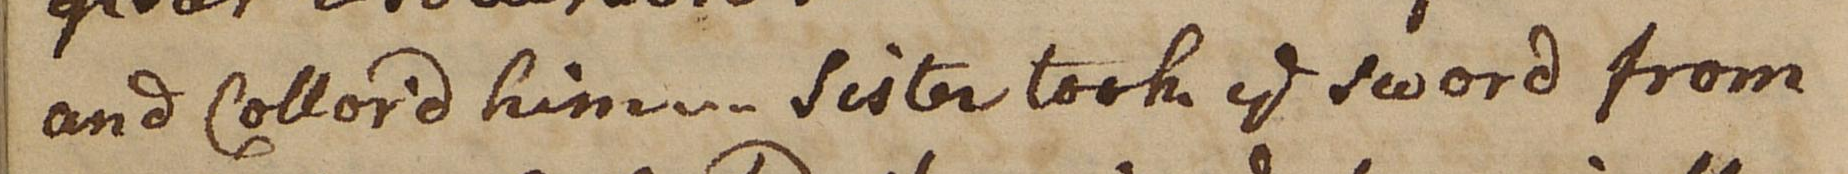and Collor'd him-- Sister took y^e sword from
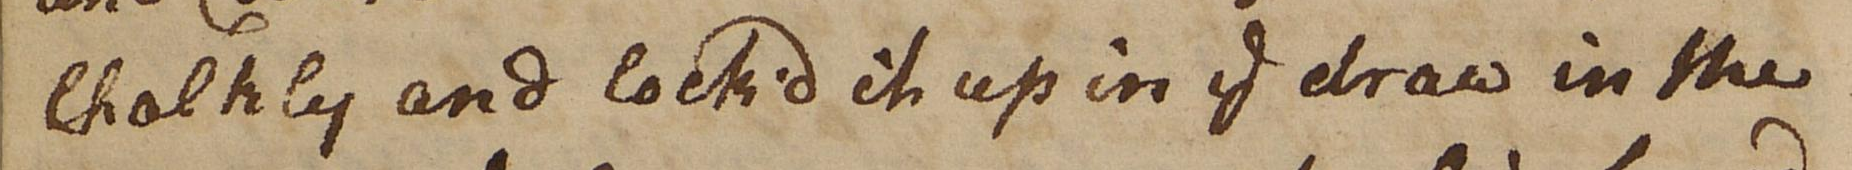Chalkly and lock'd it up in y^e draw in the
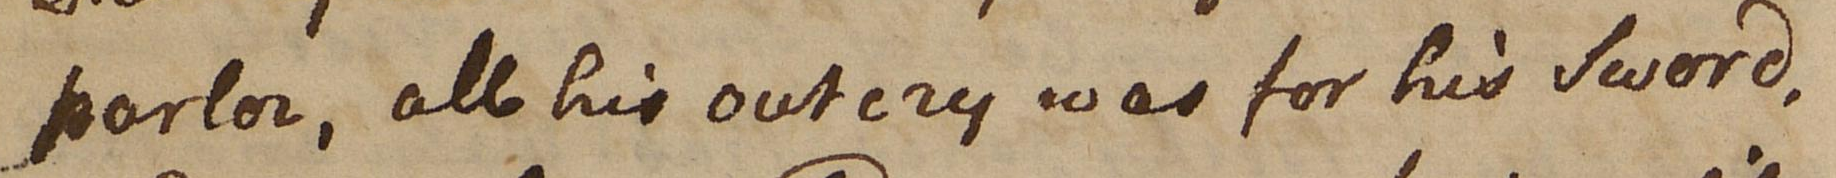parlor, all his outcry was for his Sword,
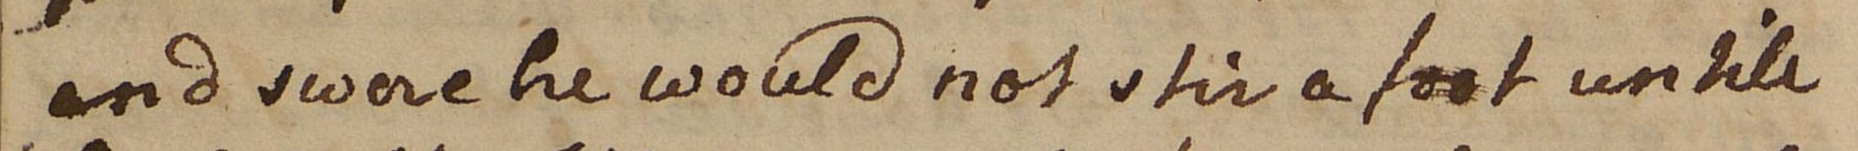and swore he would not stir a foot untill
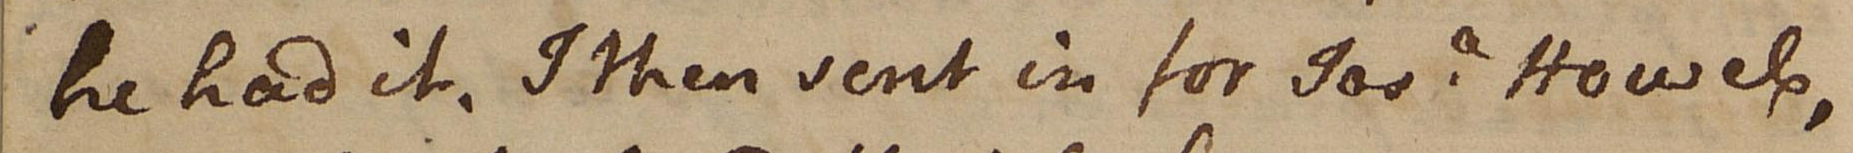he had it. I then sent in for Jos^a. Howel,
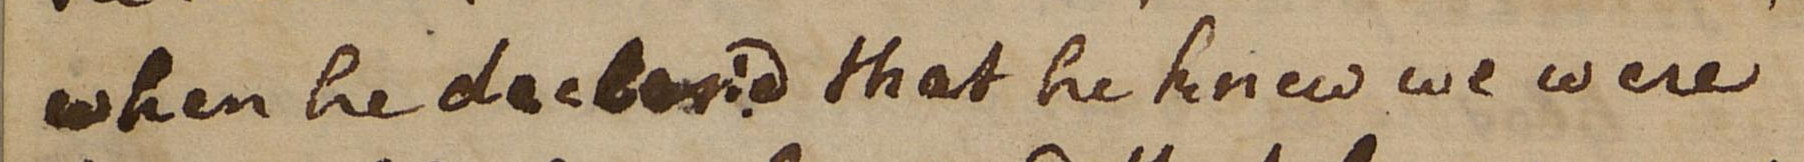when be declar'd that he knew we were
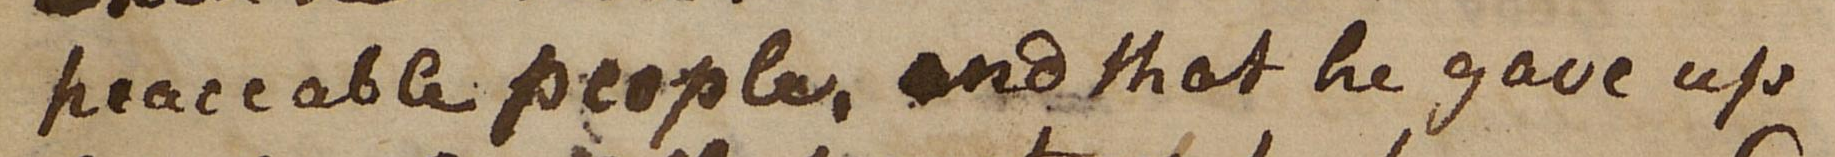peaceable people, and that he gave up
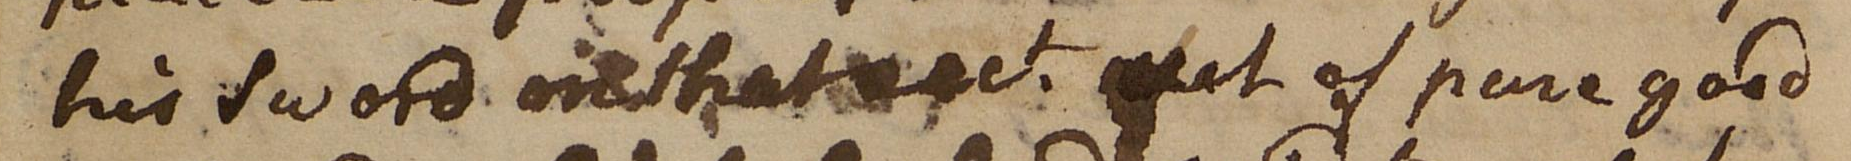his Sword on that rec^t. out of pure good
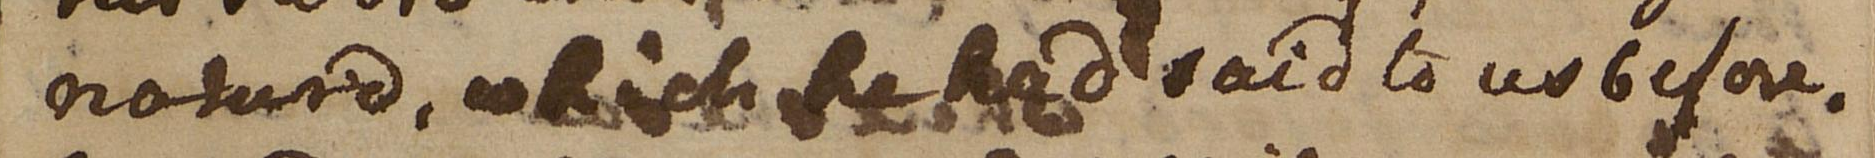natur'd, which he had said to us before.
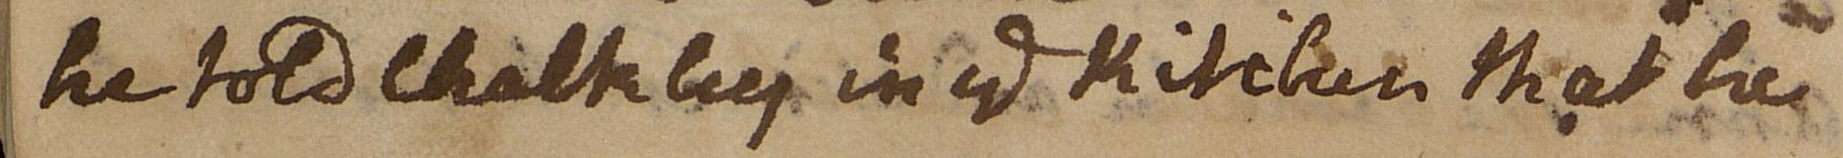he told Chalkley in y^e Kitchen that he
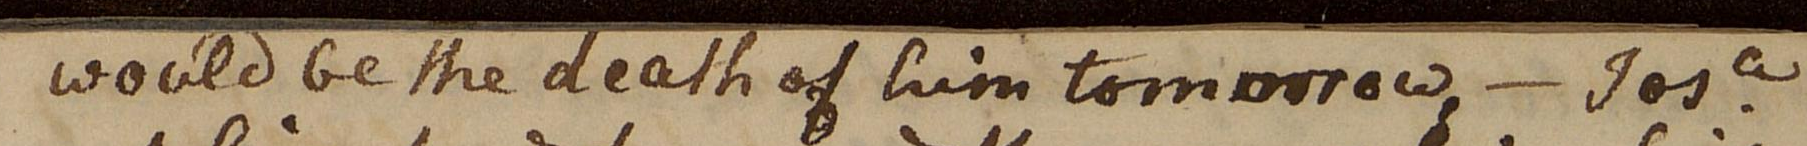would be the death of him tomorrow.- Jos^a.
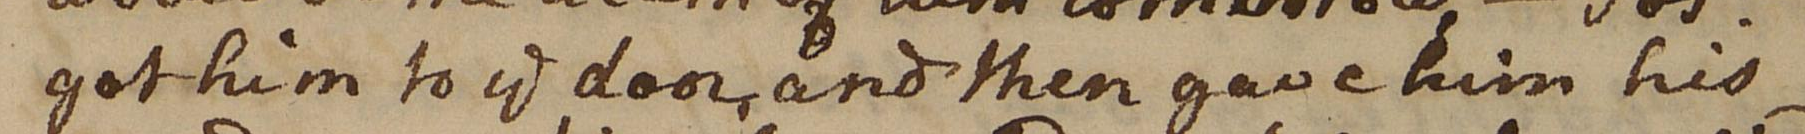got him to y^e door, and then gave him his
